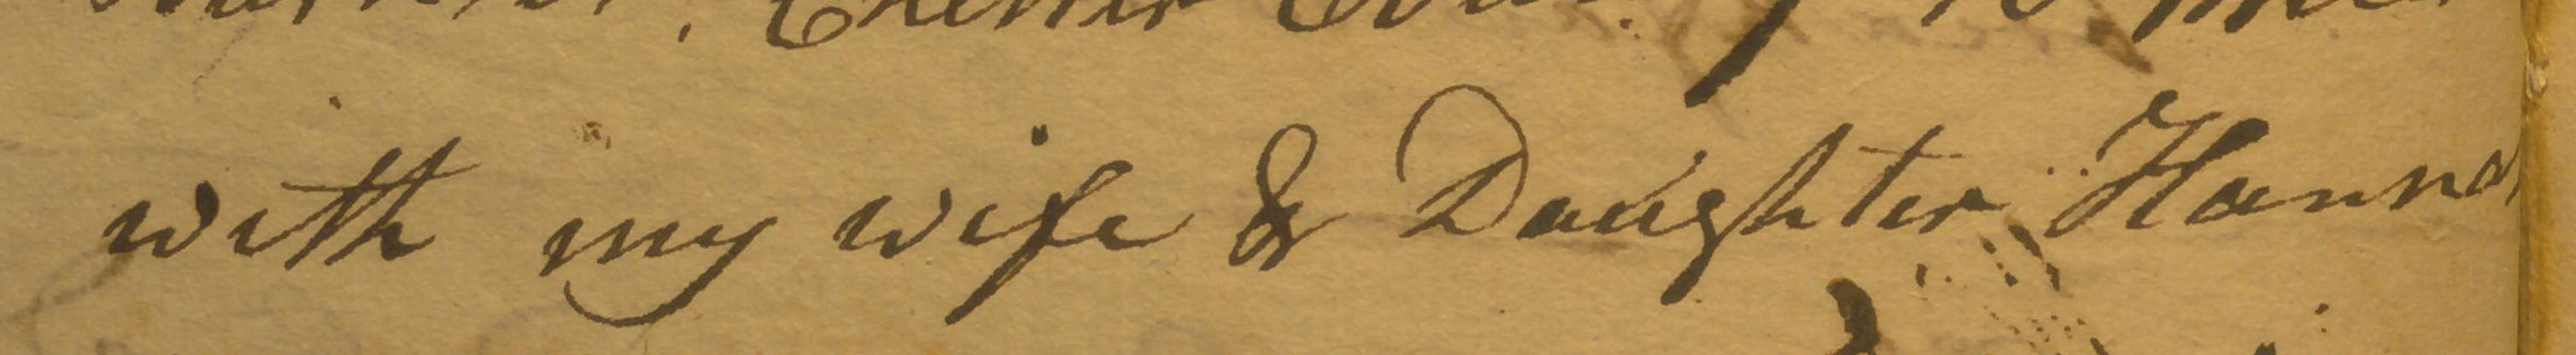with my wife & Daughter Hanna
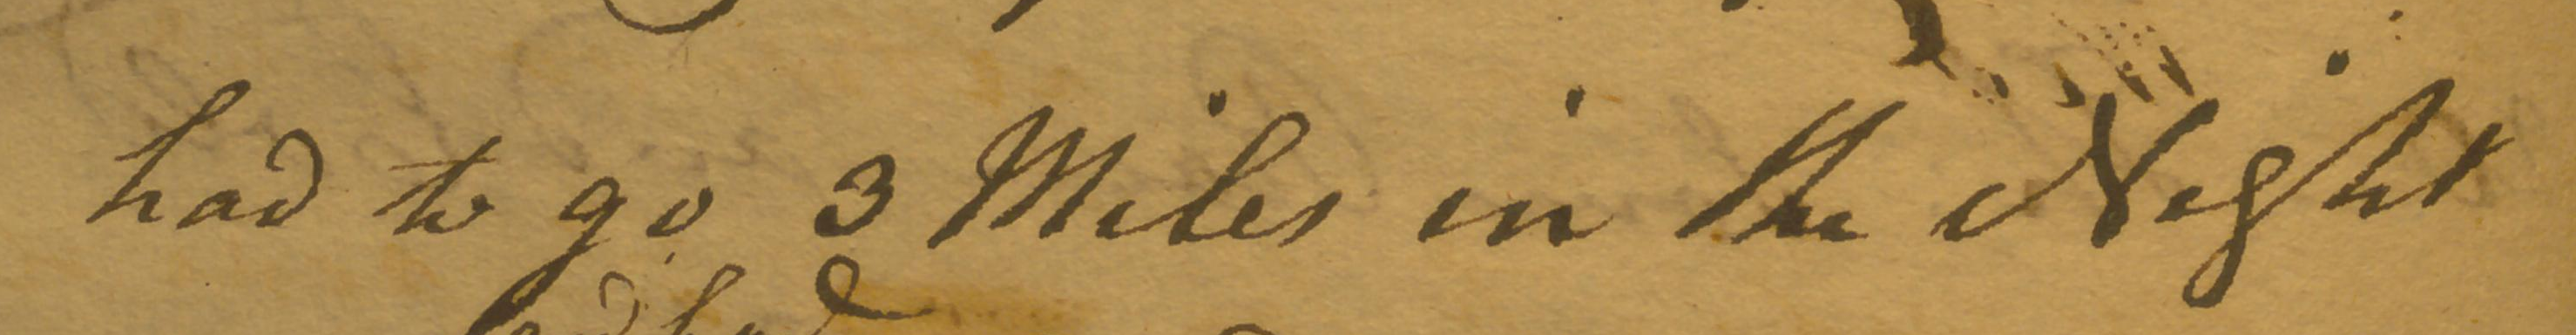had to go 3 Miles in the Night
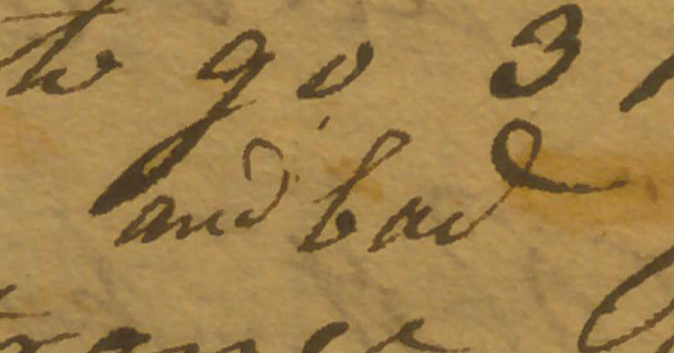and bad
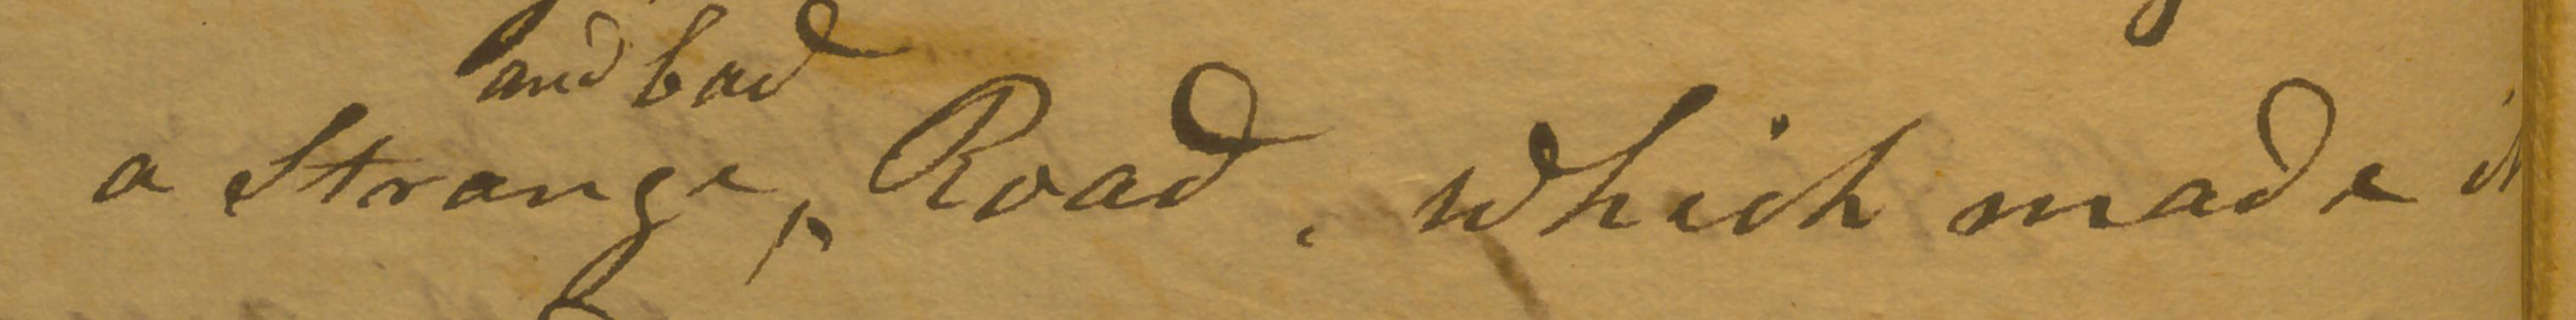a Strange ^ Road. which made it
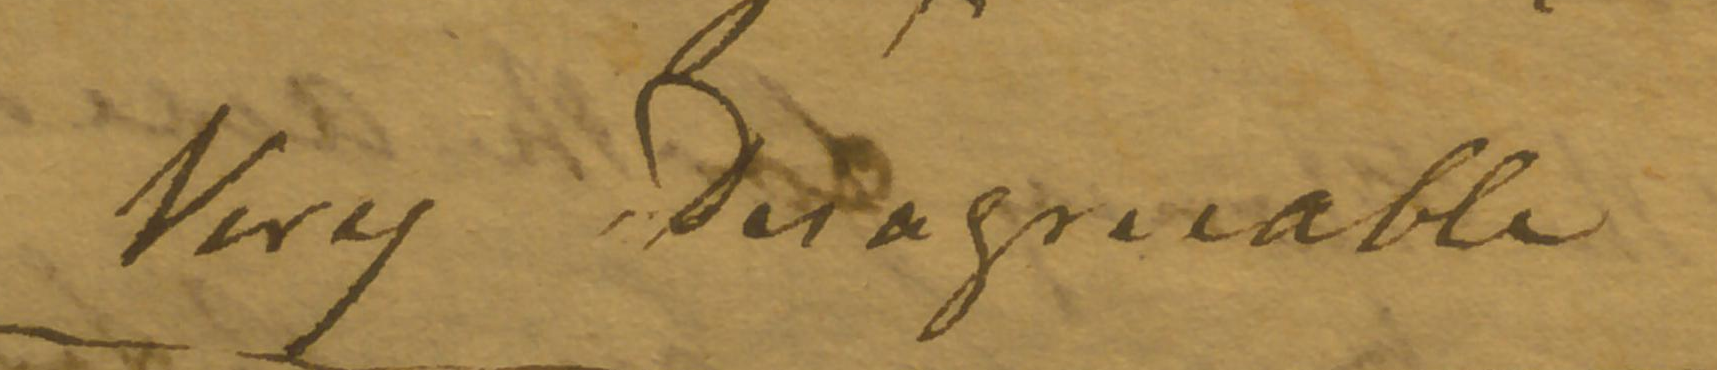Verey disagreeable
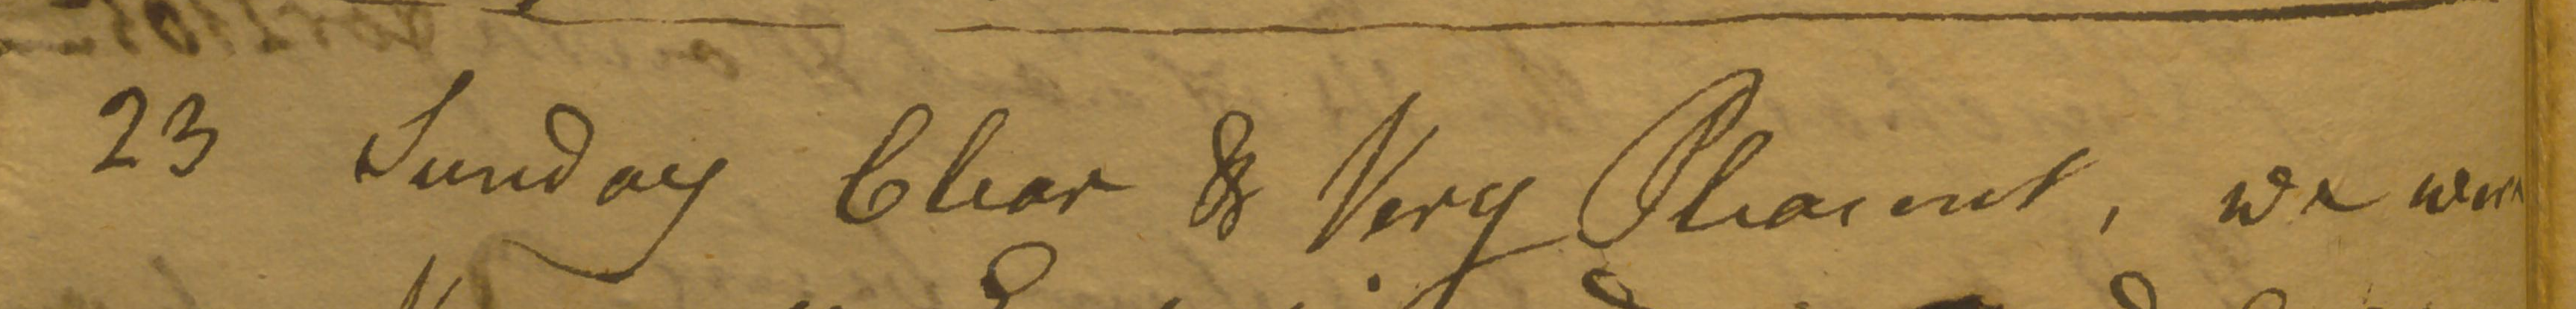23 Sunday Clear & Very Pleasent, we were
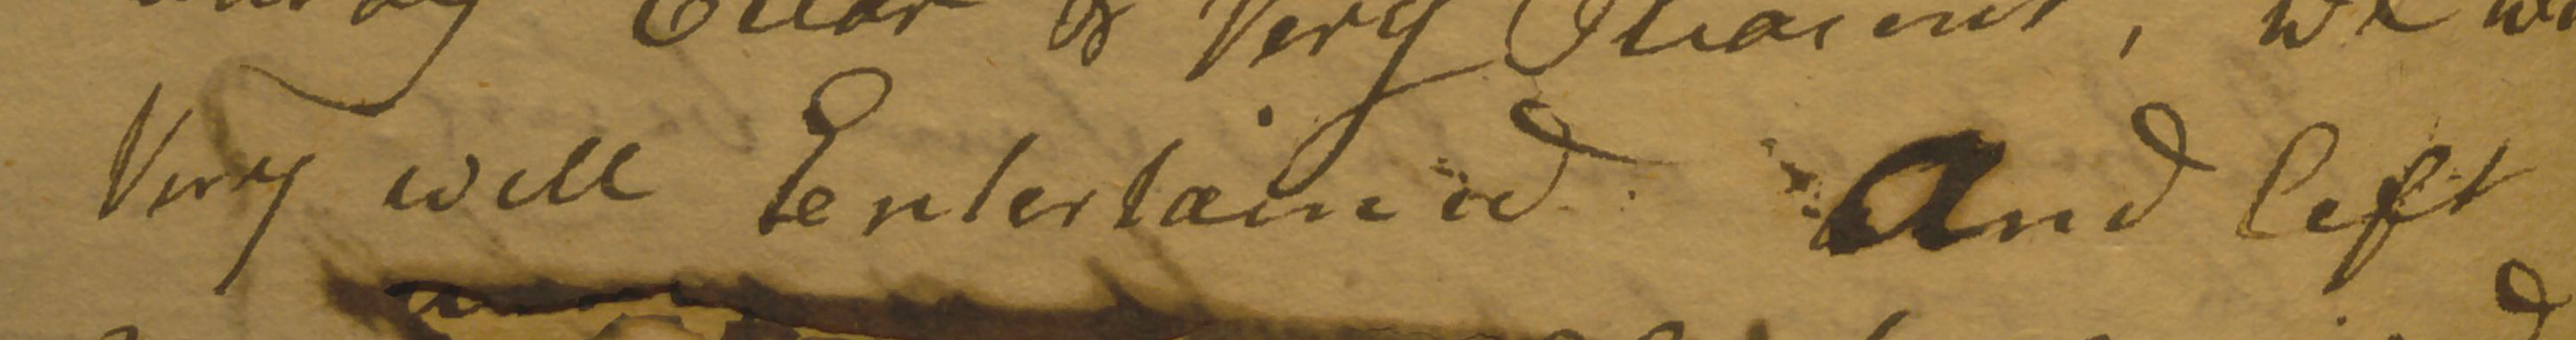Very well Entertained. and left
